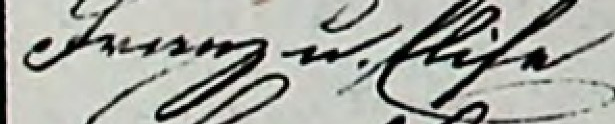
Franz u. Elise
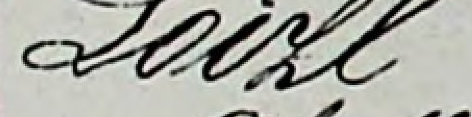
Loizl
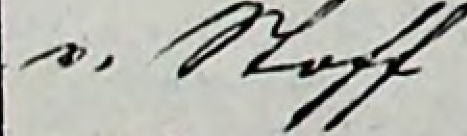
v. Stoff
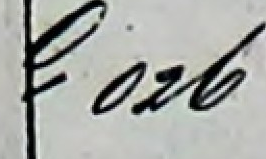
0,026
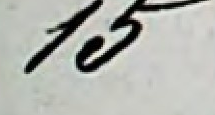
15
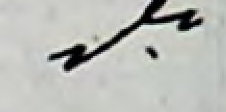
do
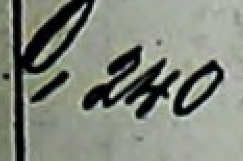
0,240
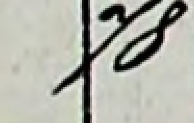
78
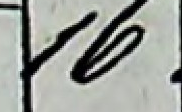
16
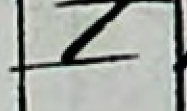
I
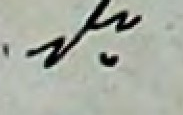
do
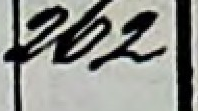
262
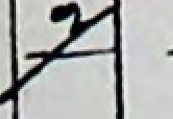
7
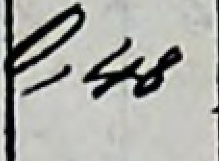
0,48
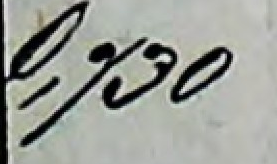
0,730
